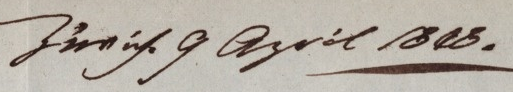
Zürich, 9 April 1848.
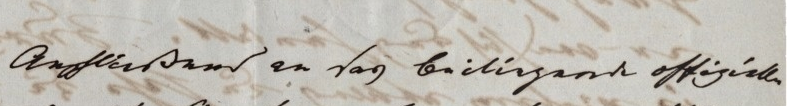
Anschließend an das beiliegende offizielle
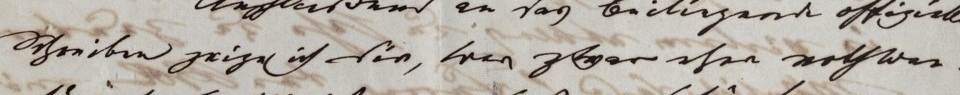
Schreiben zeige ich Dir, was zwar eher nothwen-
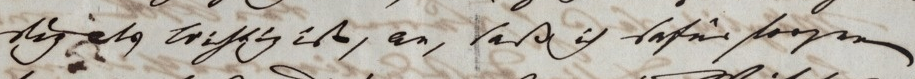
dig als wichtig ist, an, daß ich dafür sorgen
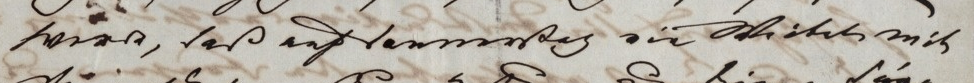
werde, daß auf Donnerstag ein Weibel mit
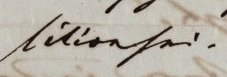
sition sei.
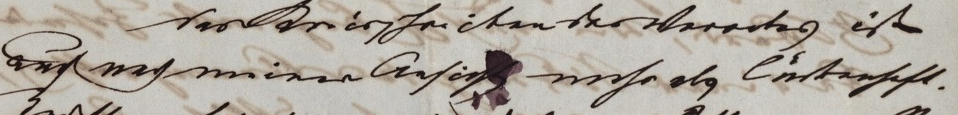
auch nach meiner Ansicht mehr als lückenhaft.
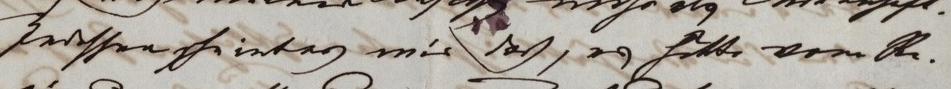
Indessen scheint es mir doch, es hätte vom Re-
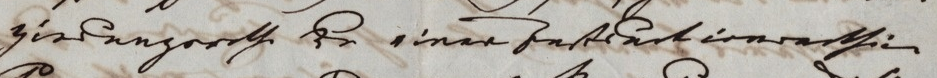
gierungsrath zu einer Instructionserthei-
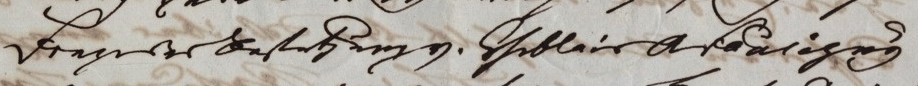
Frage der Besetzung v. Chablais & Faucigny
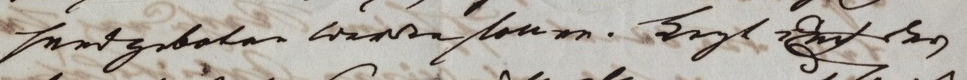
handgeboten werden sollen. Legt auch der
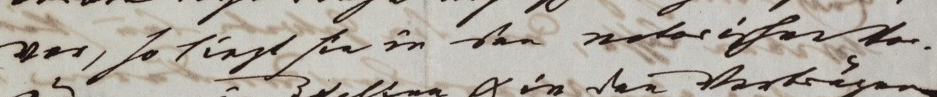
vor, so liegt sie in den notorischen Vor-
